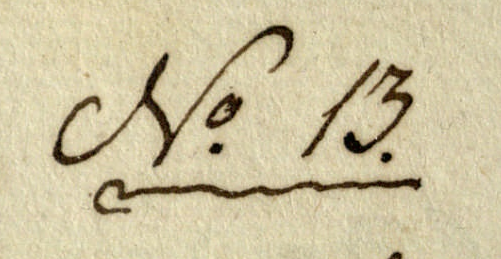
No 13.
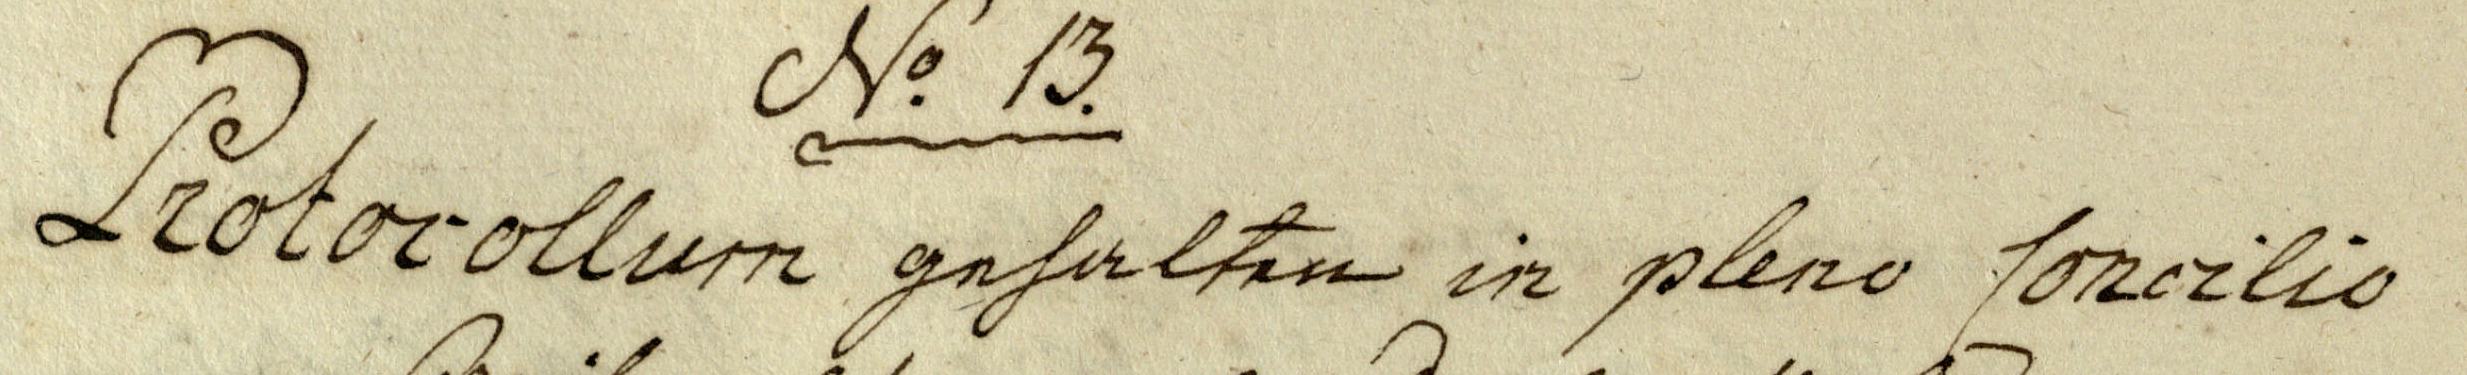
Protocollum gehalten in pleno Concilio
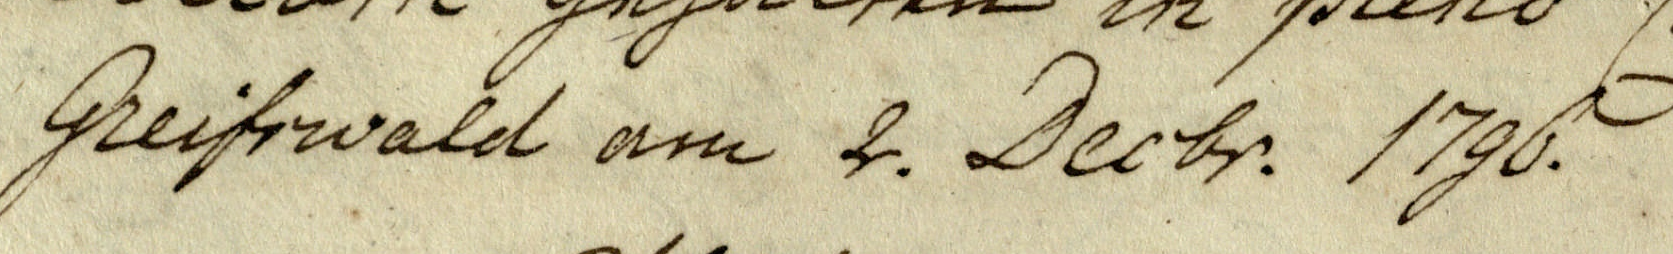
Greifswald am 2. Decbr. 1796.
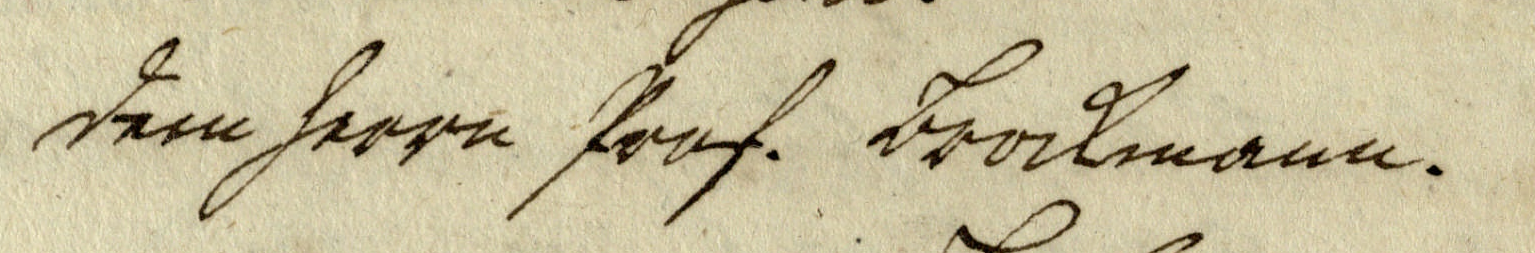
dem Herrn Prof. Brockmann.
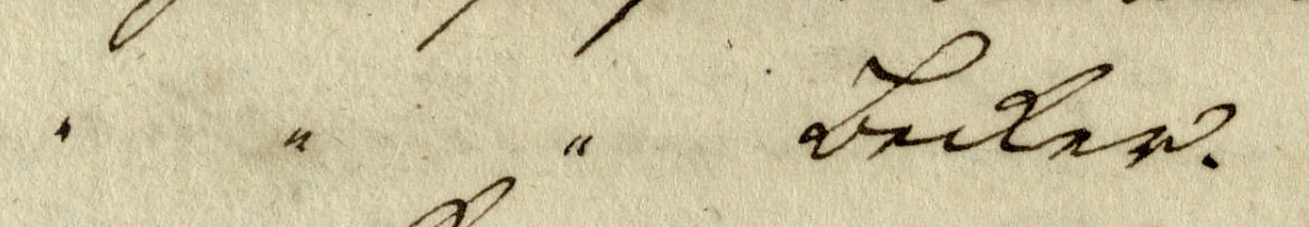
Becker.
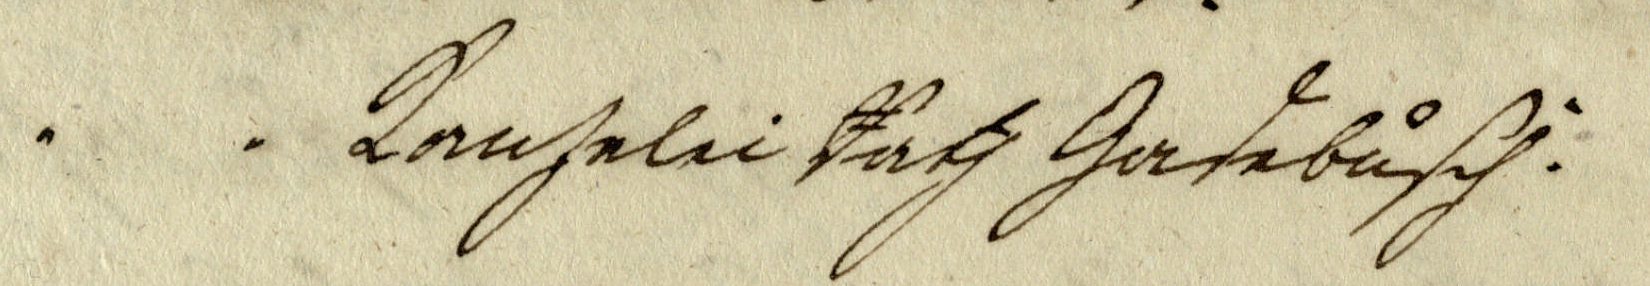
Kanzelei Rath Gadebusch.
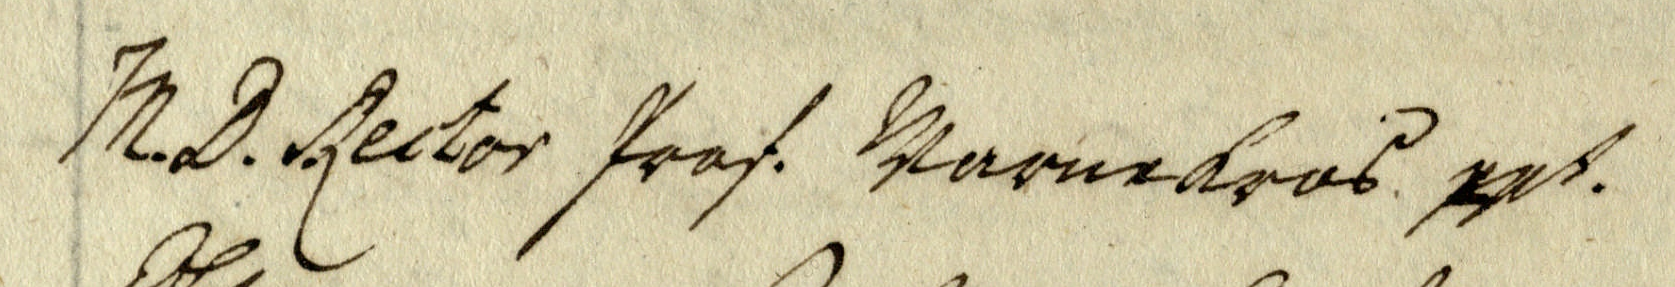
M. D. Rector Prof. Warnekros ppt.
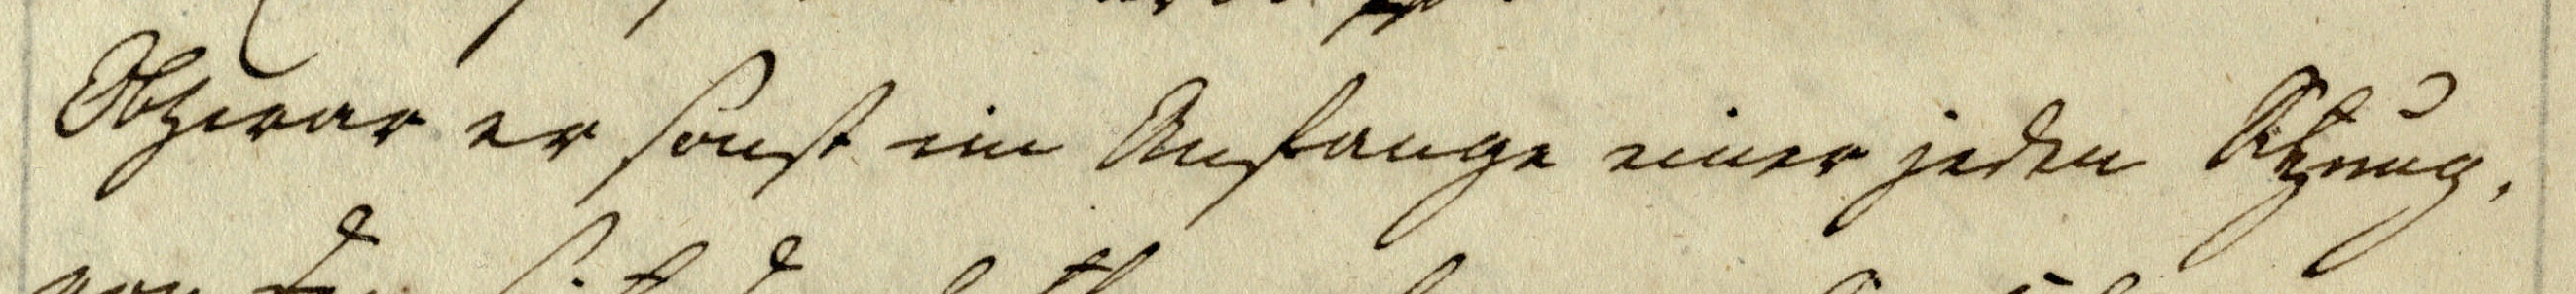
Obzwar er sonst im Anfange einer jeden Sitzung,
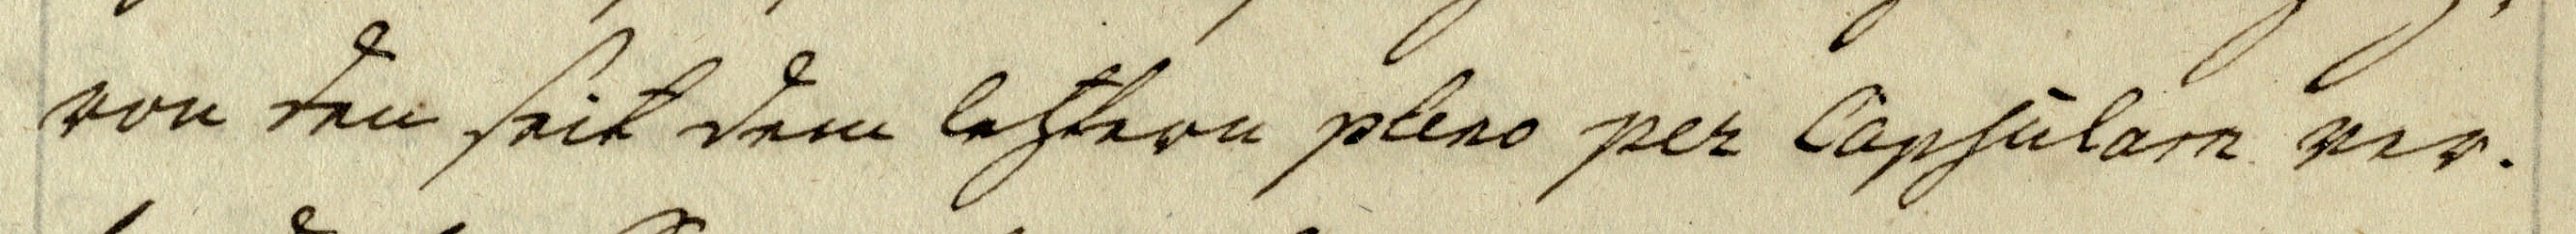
von den seit dem letztern pleno per Capsulam ver¬
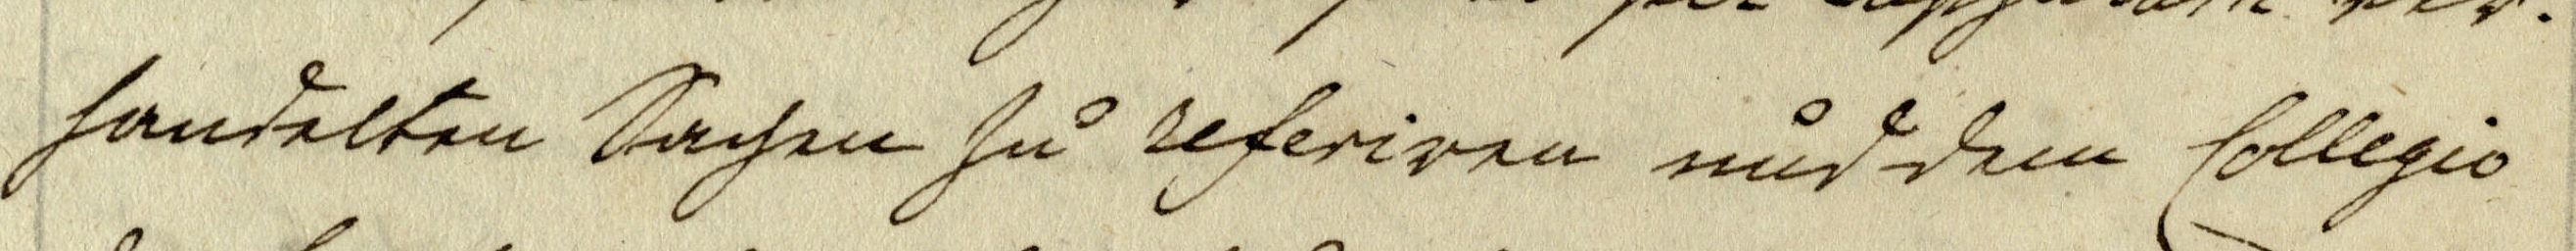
handelten Sachen zu referiren und dem Collegio
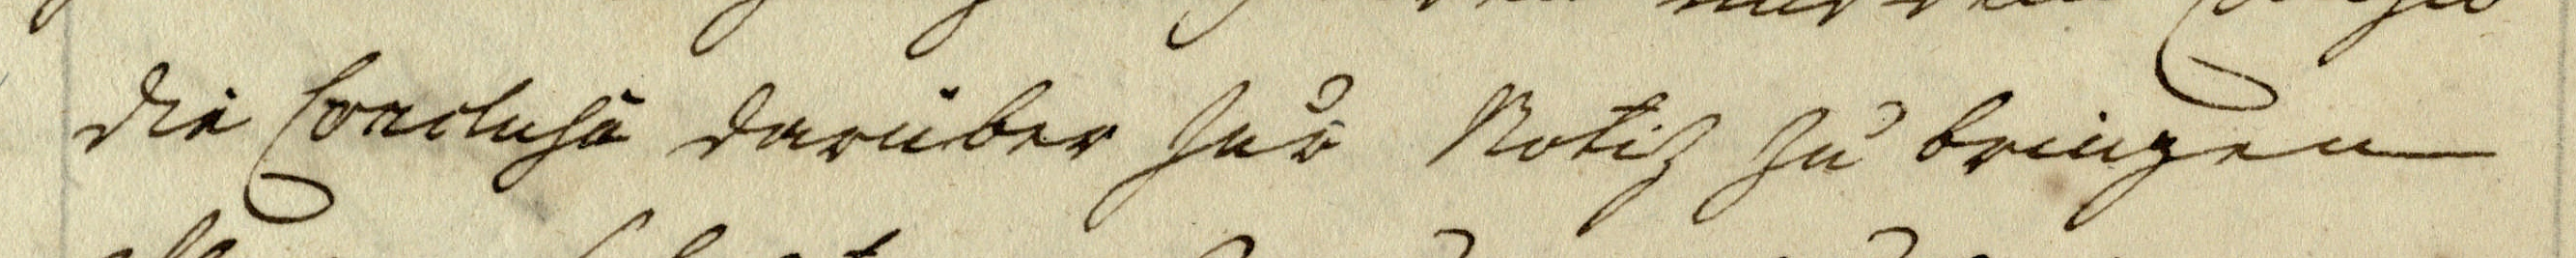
die Conclusa darüber zur Notiz zu bringen
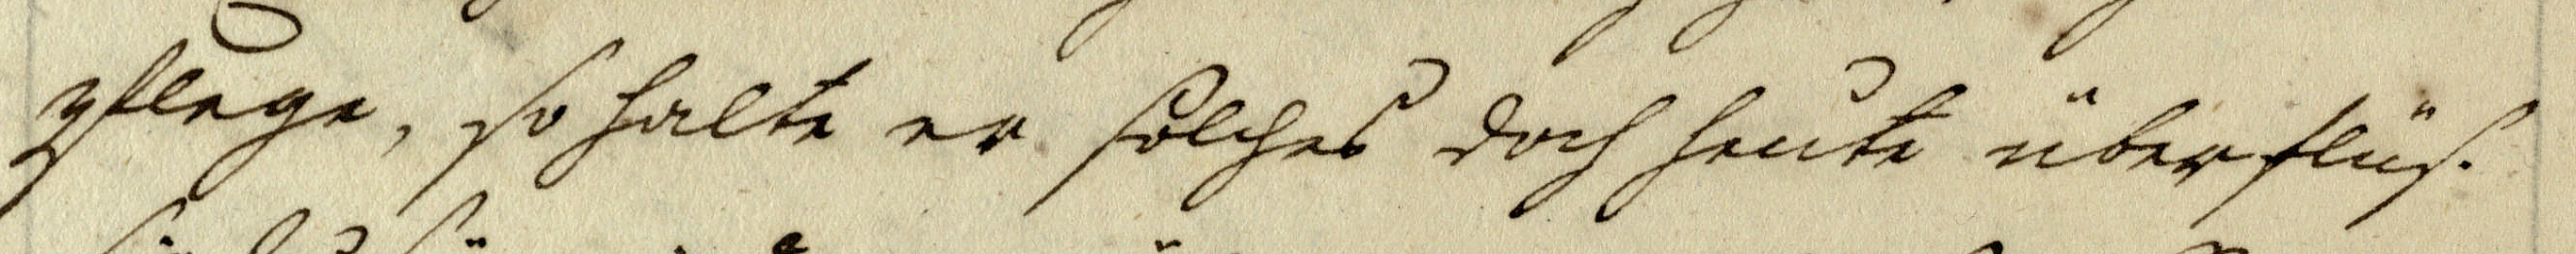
pflege, so halte er solches doch heute überflüs¬
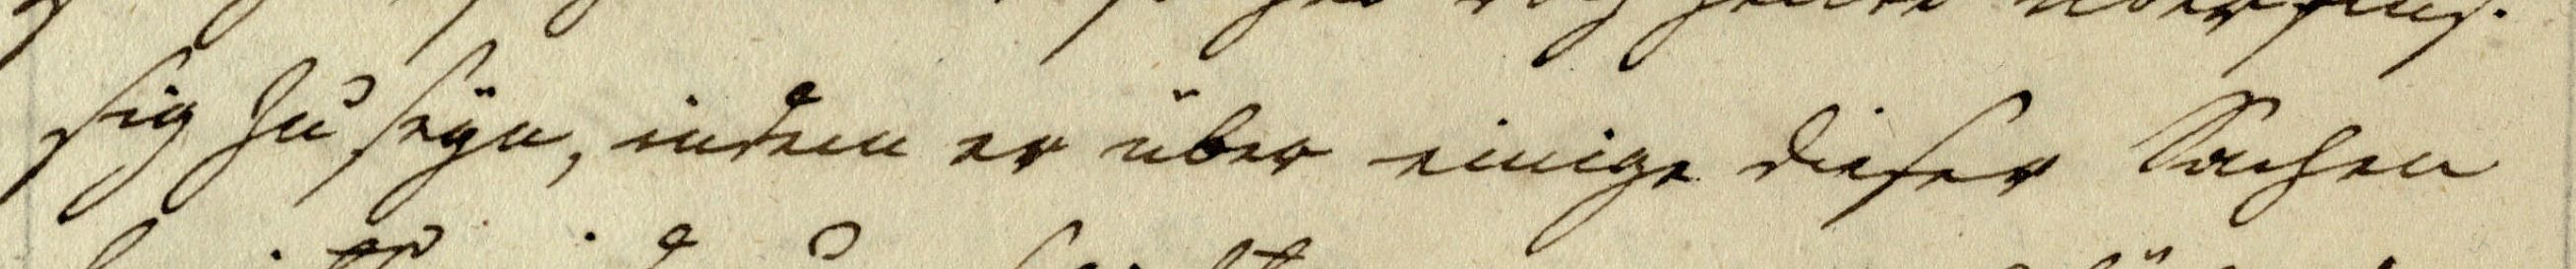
sig zu seÿn, indem er über einige dieser Sachen
